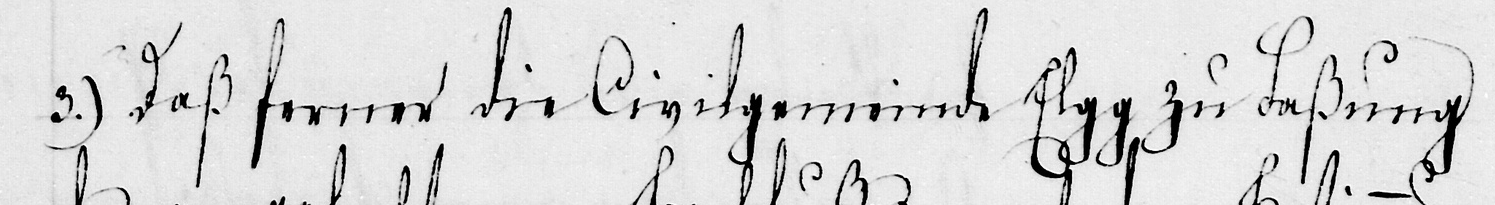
3.) Daß ferner die Civilgemeinde Elgg zu Faßung
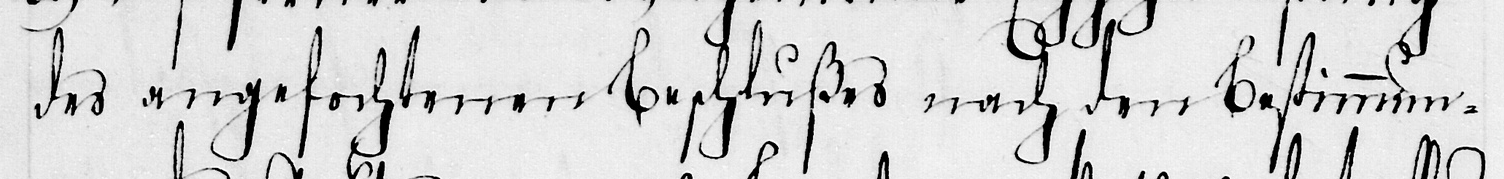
des angefochtenen Beschlußes nach den Bestimmun¬
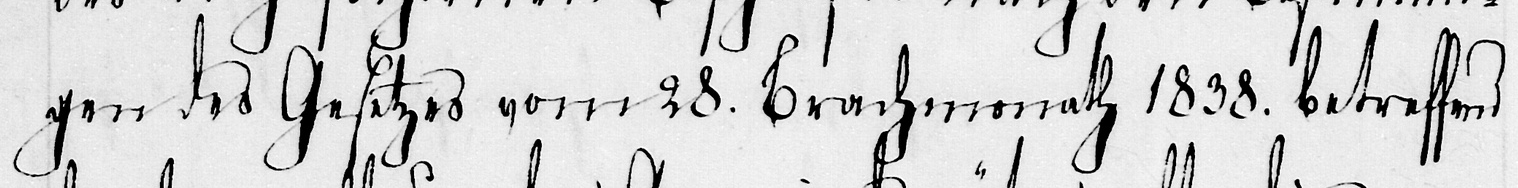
gen des Gesetzes vom 28. Brachmonath 1838. betreffe¬
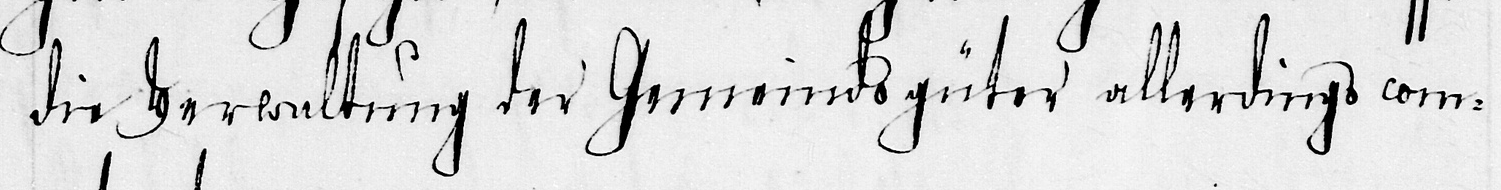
die Verwaltung der Gemeindsgüter allerdings com¬
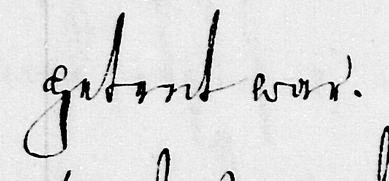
petent war.
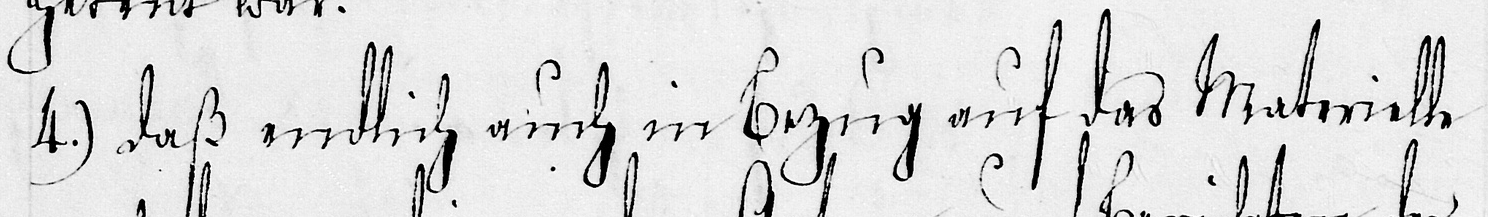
4.) Daß endlich auch in Bezug auf das Materielle
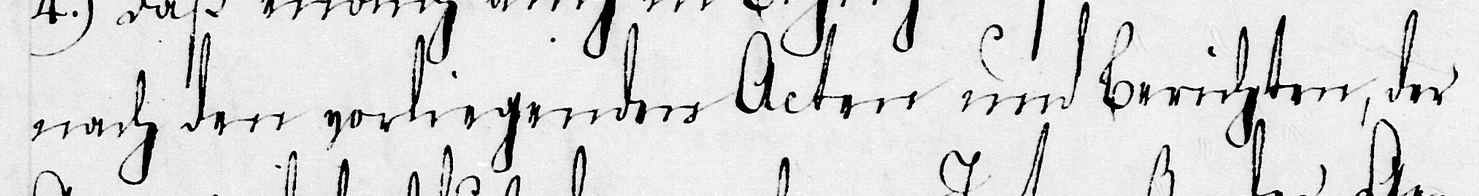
nach den vorliegenden Acten und Berichten, der
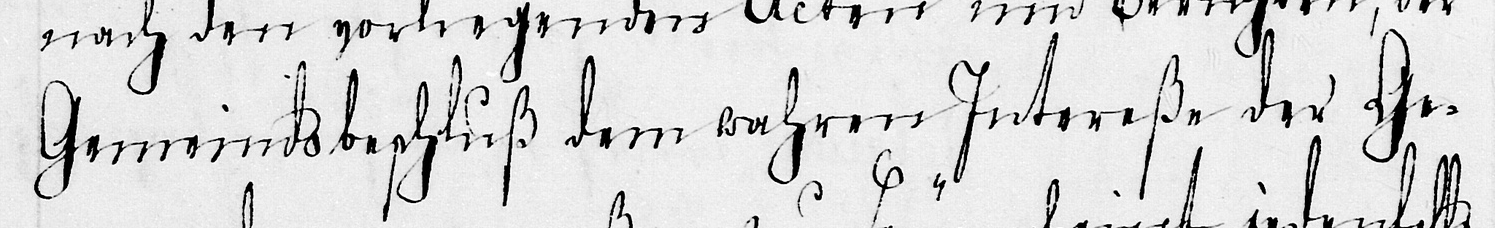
Gemeindsbeschluß dem wahren Intereße der Ge¬
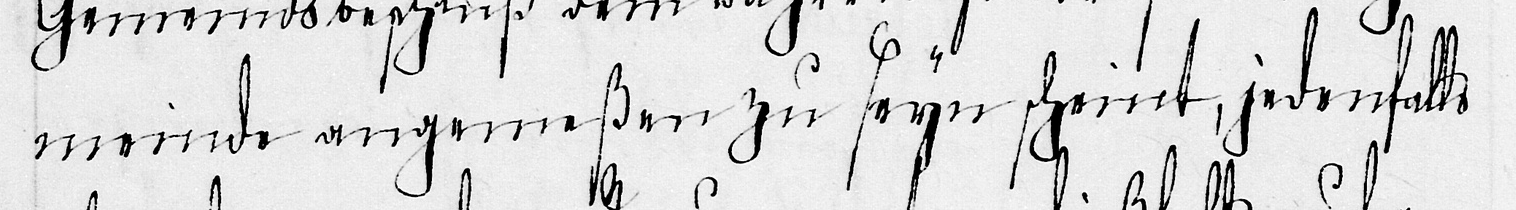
meinde angemeßen zu seyn scheint, jedenfalls
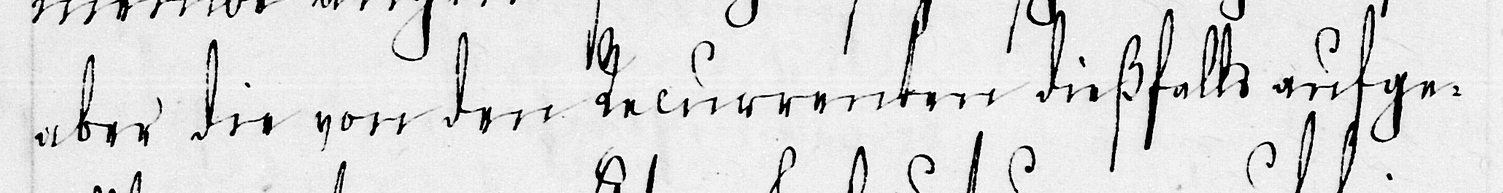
aber die von den Recurrenten dießfalls aufge¬
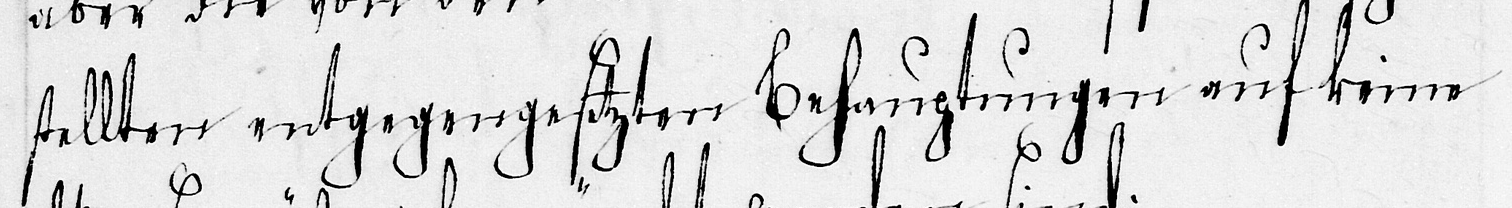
stellten entgegengesetzten Behauptungen auf keine
